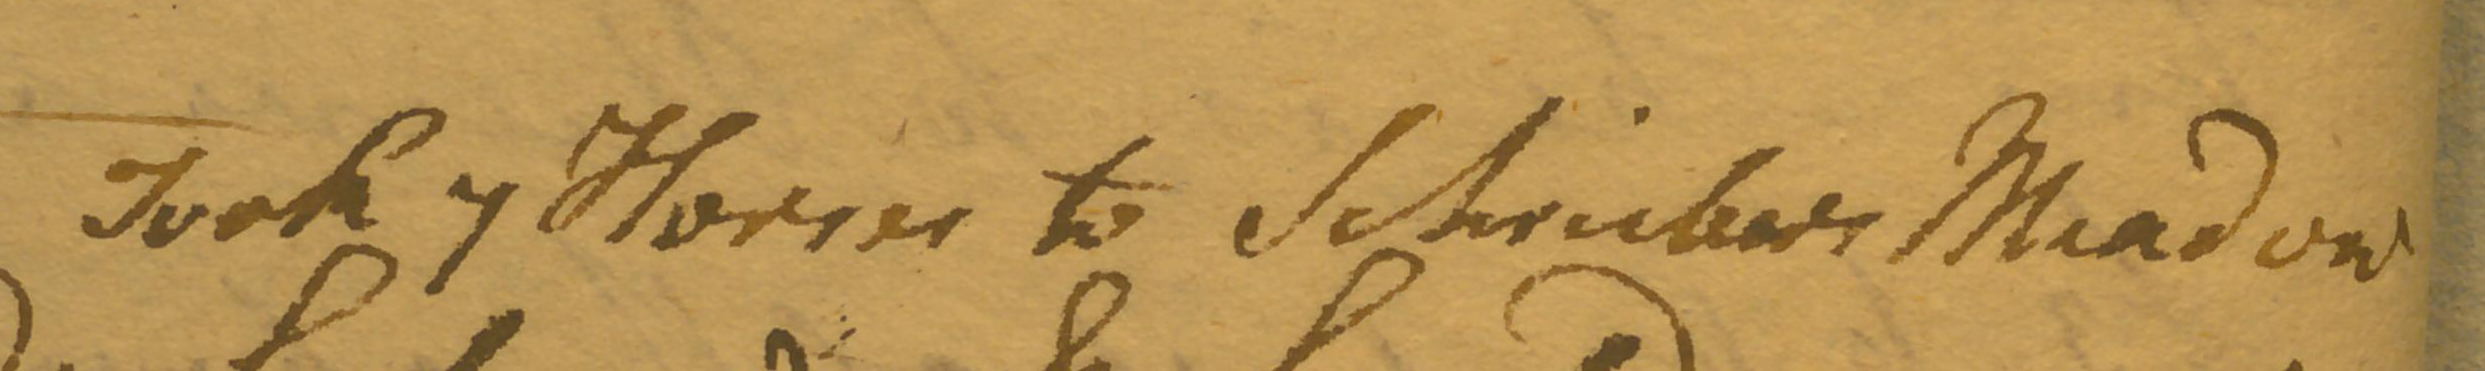Took 7 Horses to Schreibers Meadow
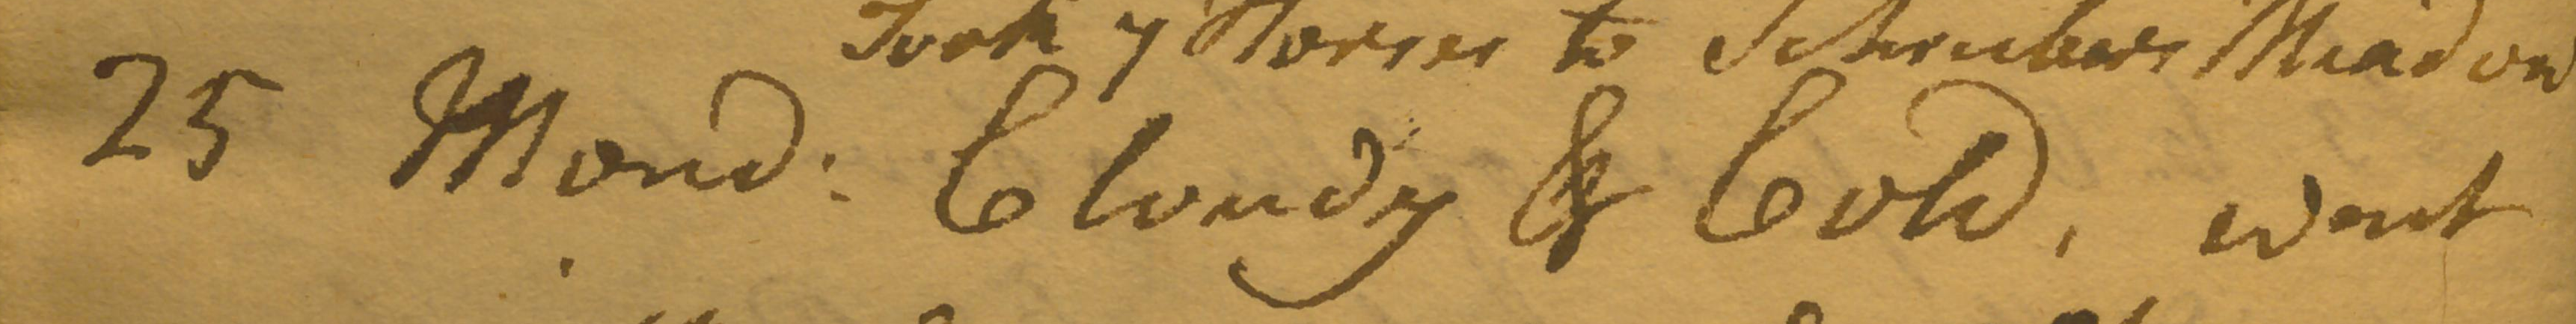25 Mond. Cloudy & Cold. went
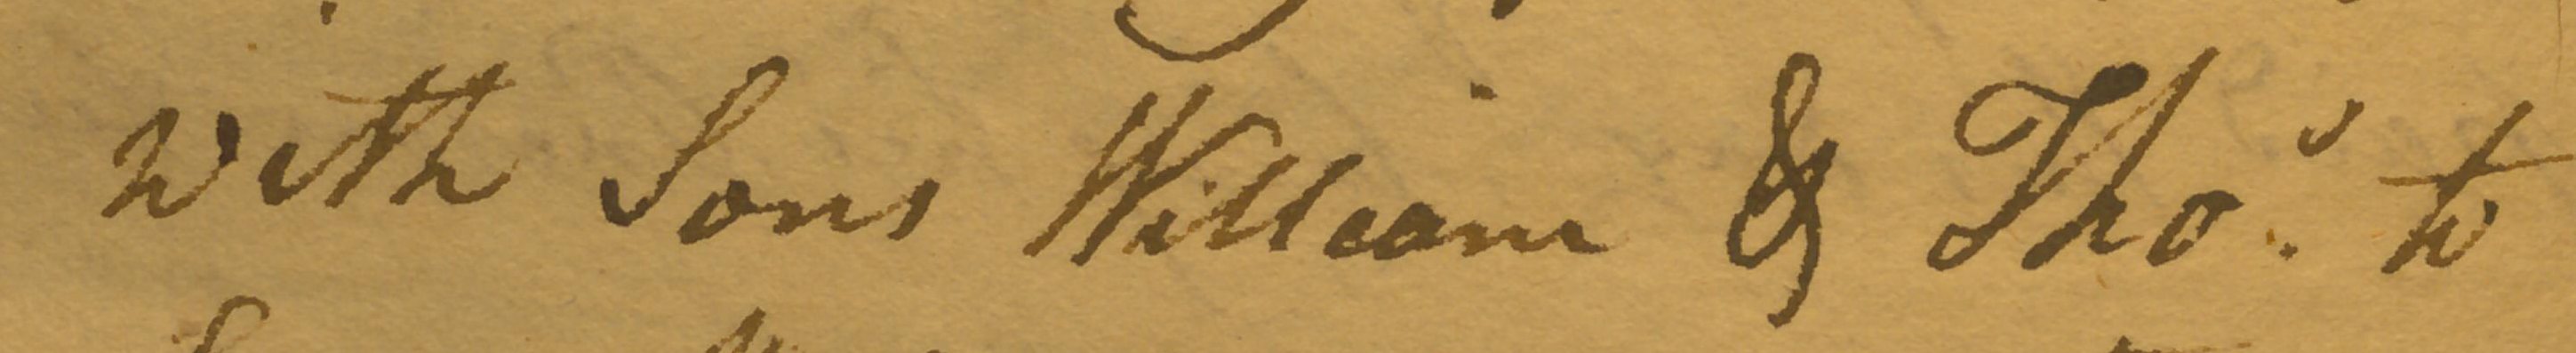with Sons William & Tho^s. to
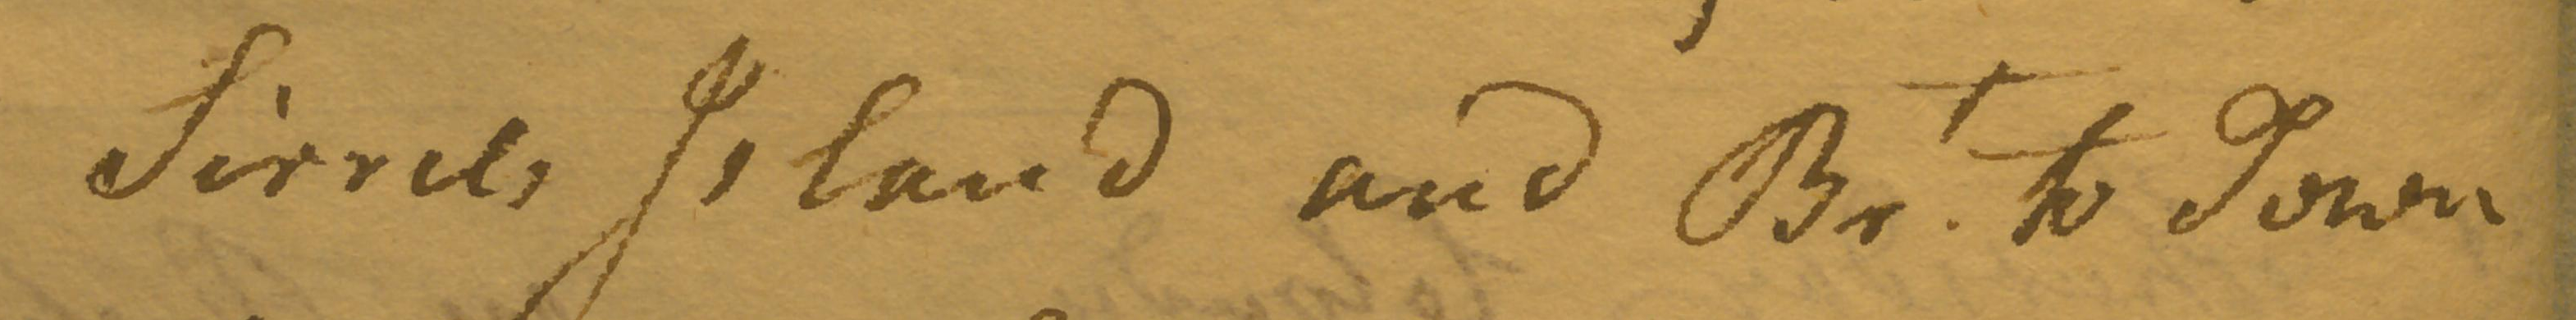Sirrels Island and Br^t. to Town
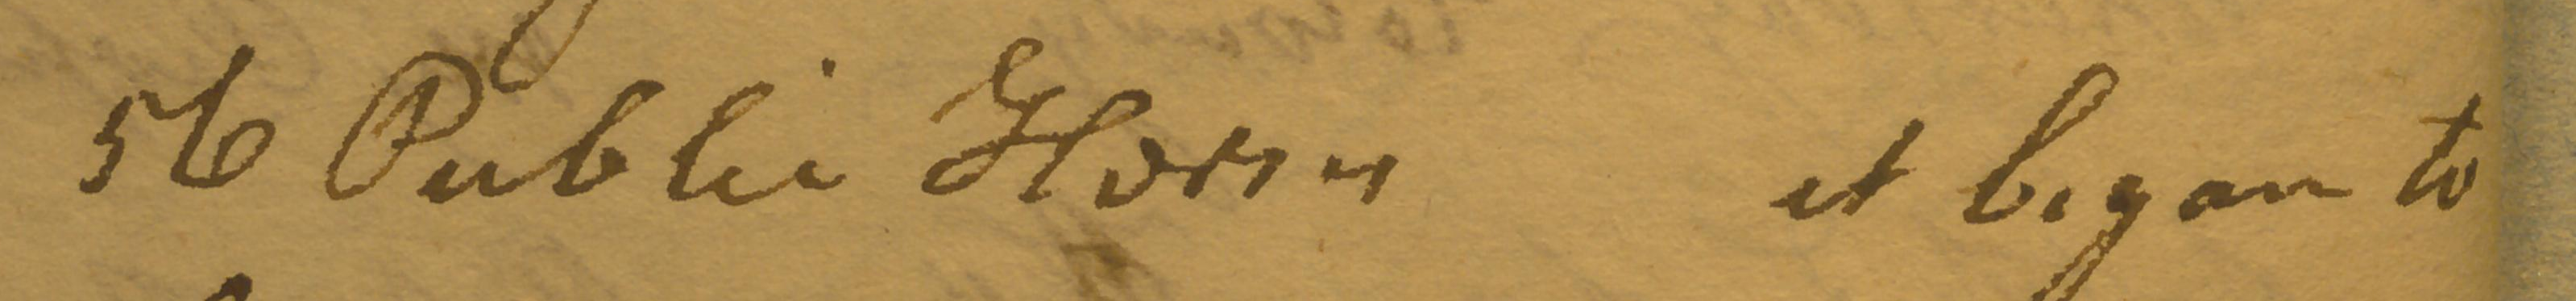56 Public Horses it began to
